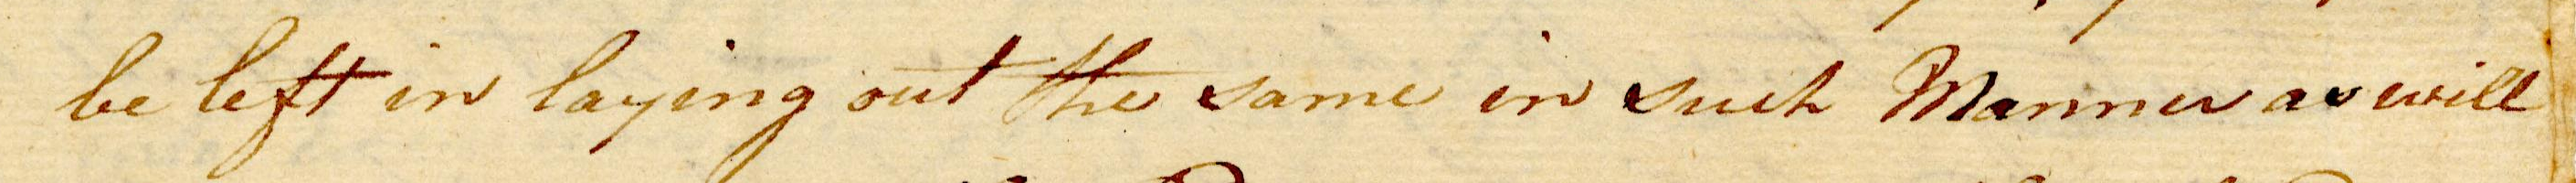be left in laying out the same in such Manner as will
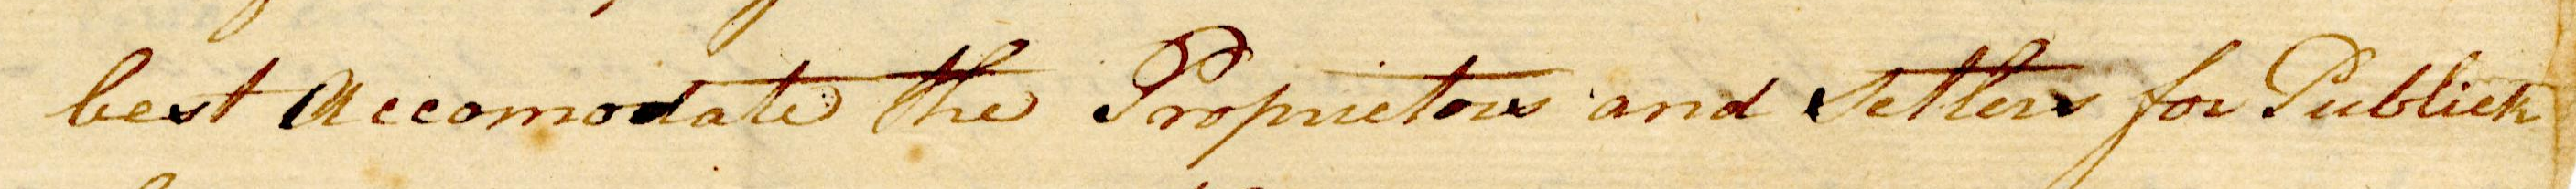best Accommodate the Proprietors and Setters for Publick
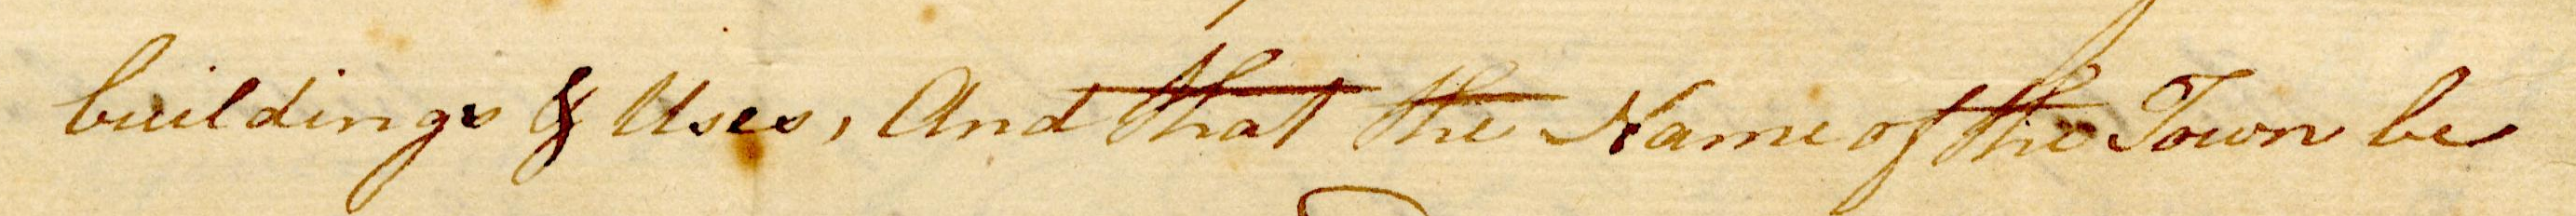buildings & Uses, And that the Name of the Town be
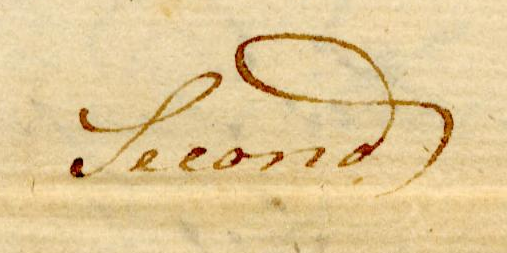Second
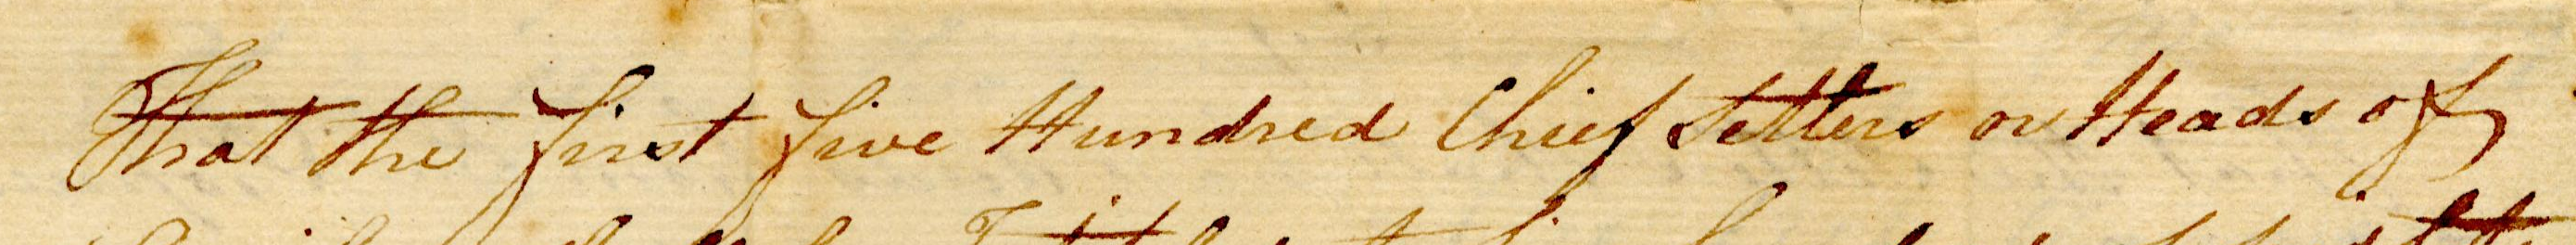that the first five Hundred Chief Letters or Heads of
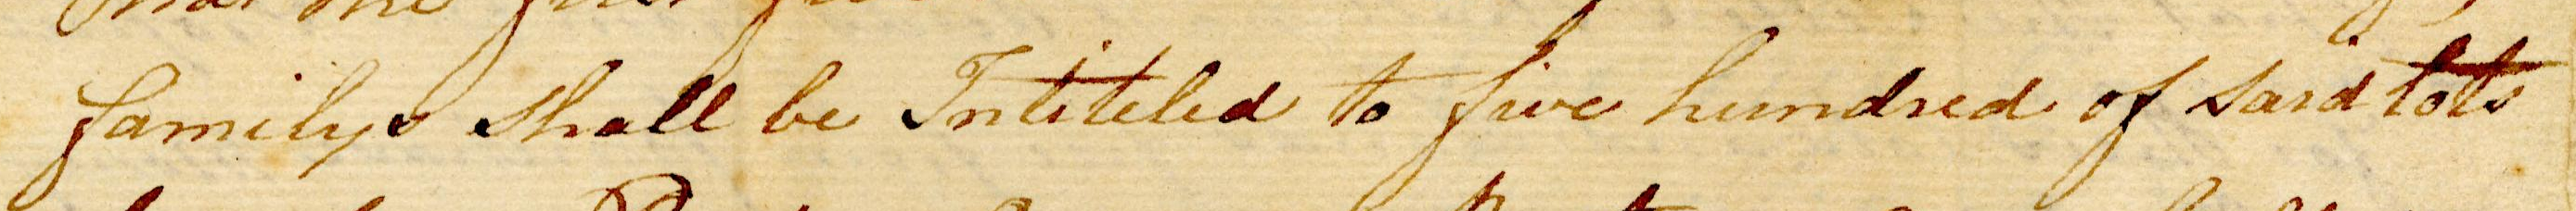familys shall be Entitled to five hundred of Said lots
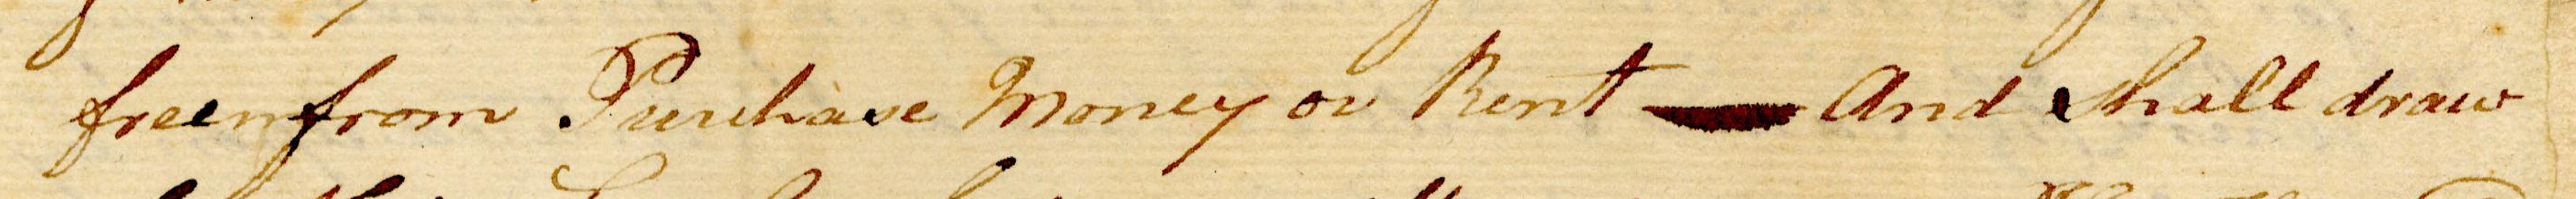free from Purchase Money or Rent- And shall draw
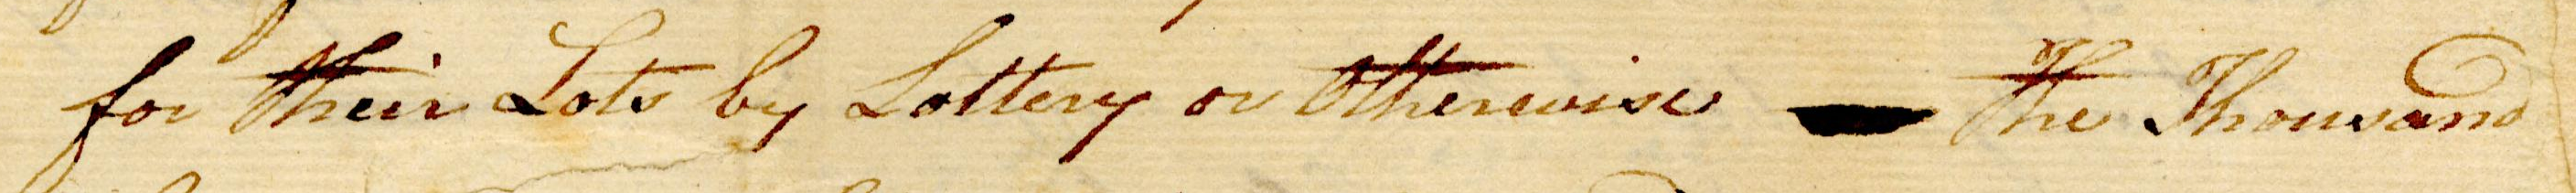for their Lots by Lottery or otherwise- The Thousand
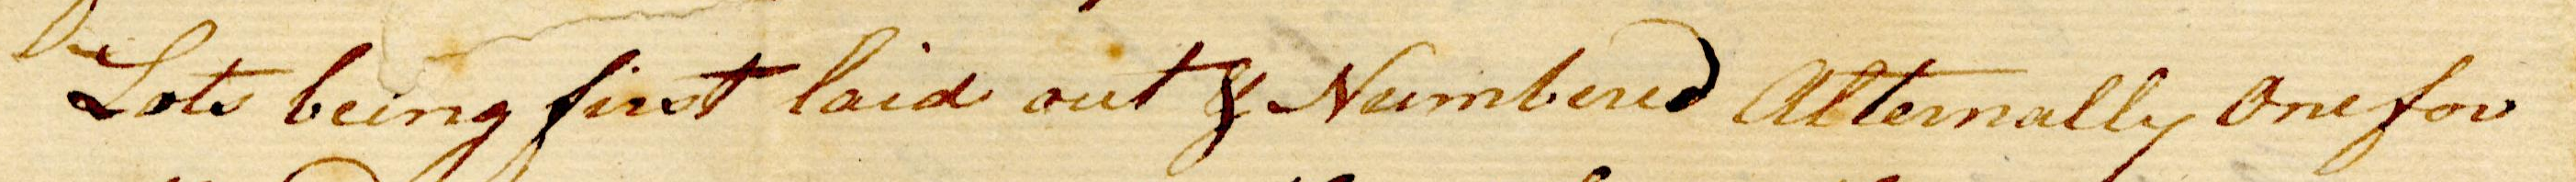Lots being first laid out & Numbered Alternally One for
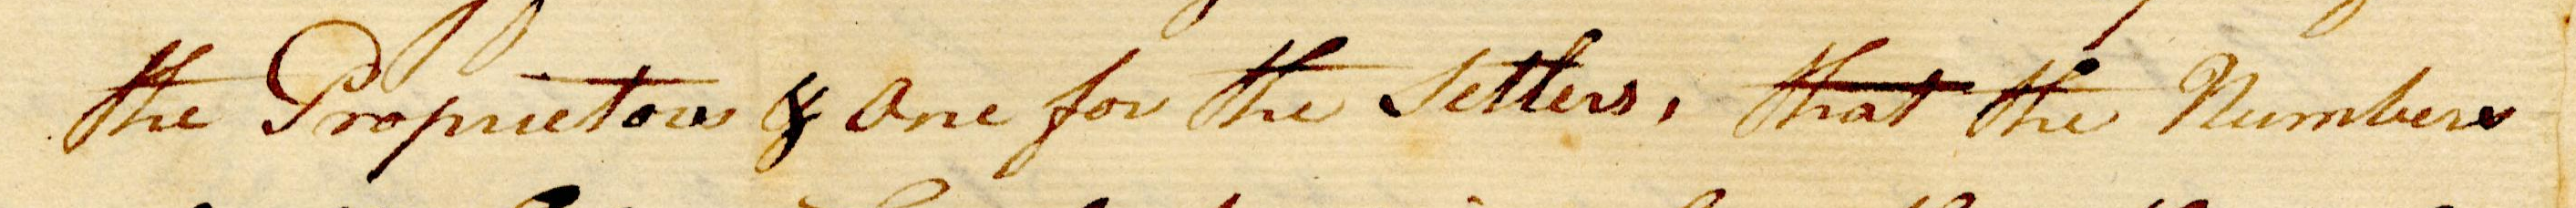the Proprietors & One for the Setlers, that the Numbers
